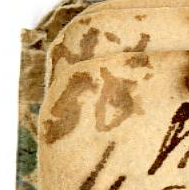50
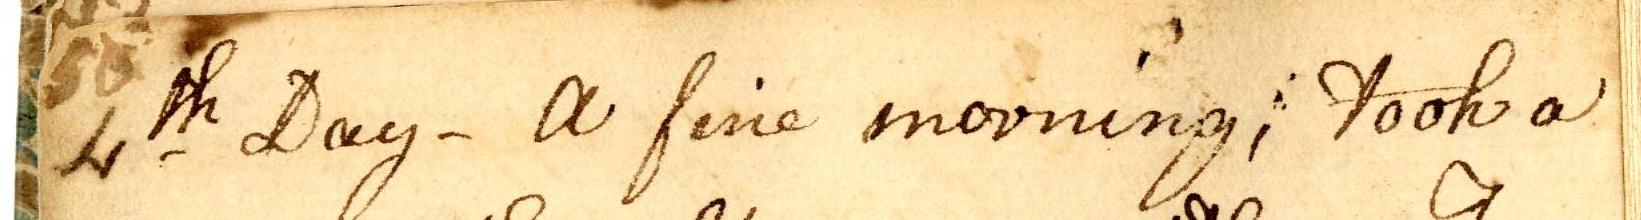4^th Day- A fine morning; took a
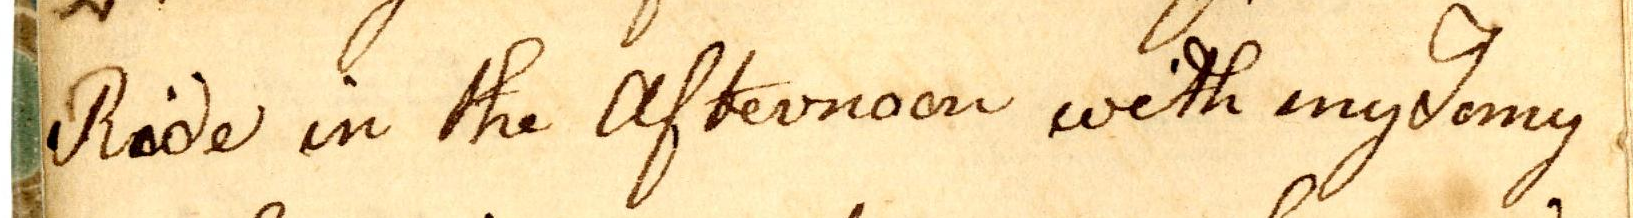Ride in the Afternoon with my Tomy
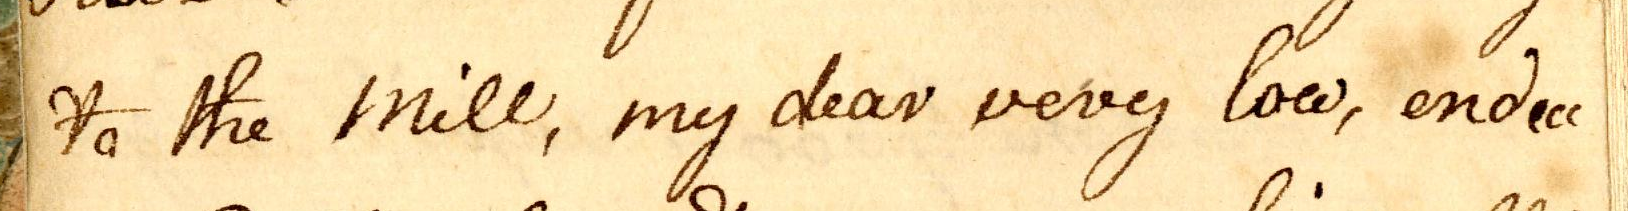to the Mill, my dear very low, endea
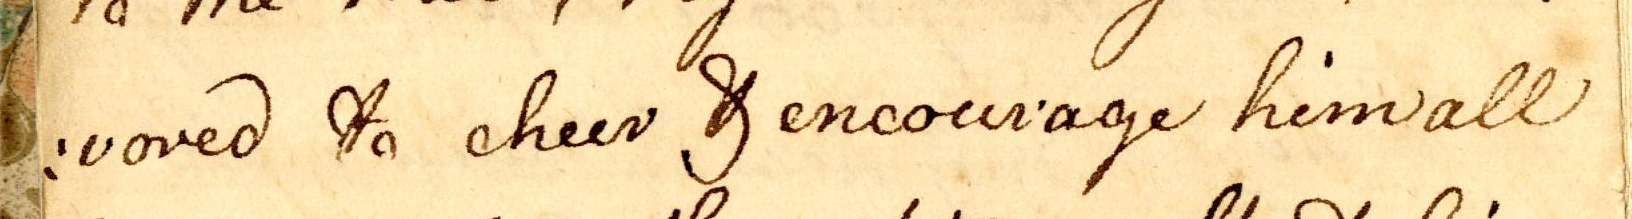-vored to cheer & encourage him all
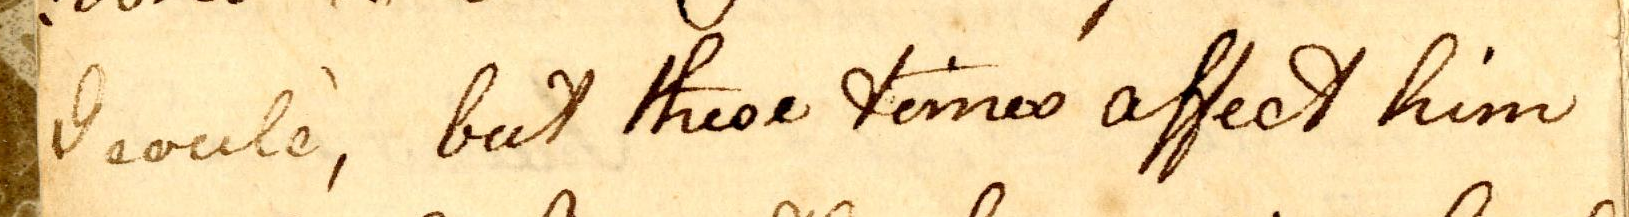I could, but these times affect him
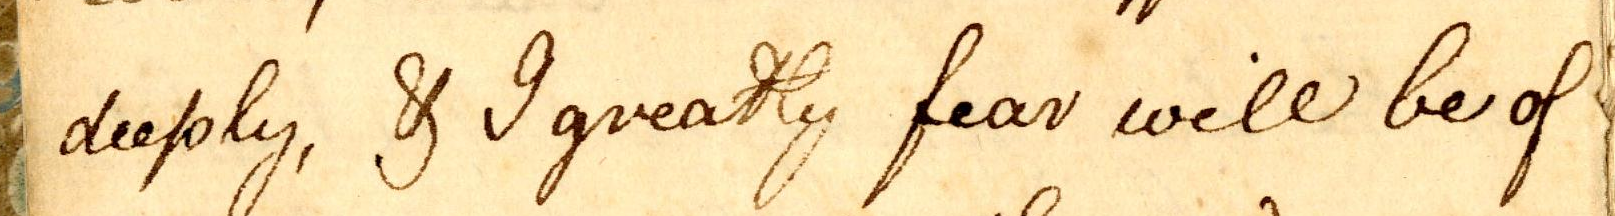deeply, & I greatly fear will be of
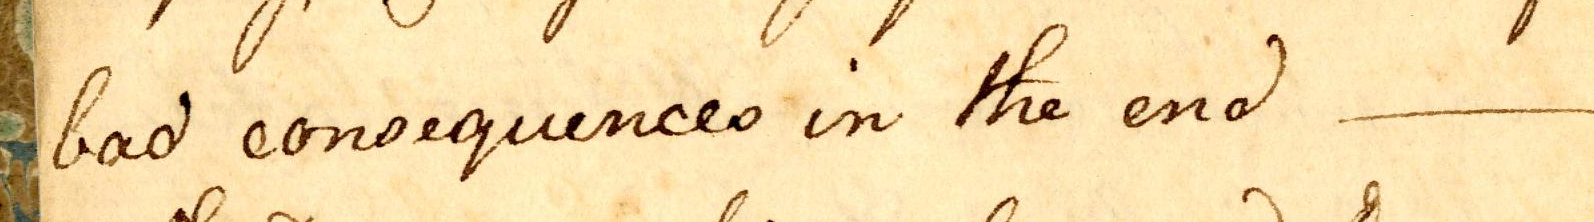bad consequences in the end-
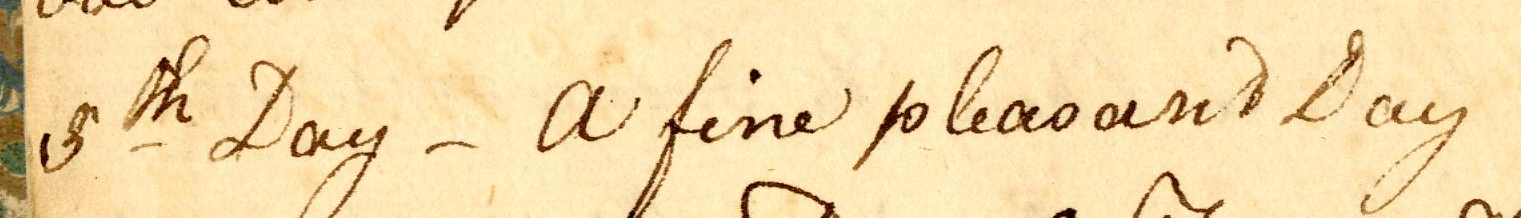5^th Day- A fine pleasant Day
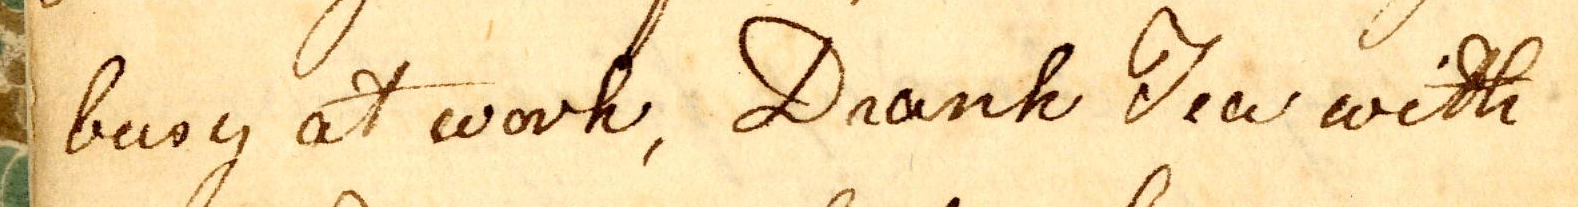busy at work, Drank Tea with
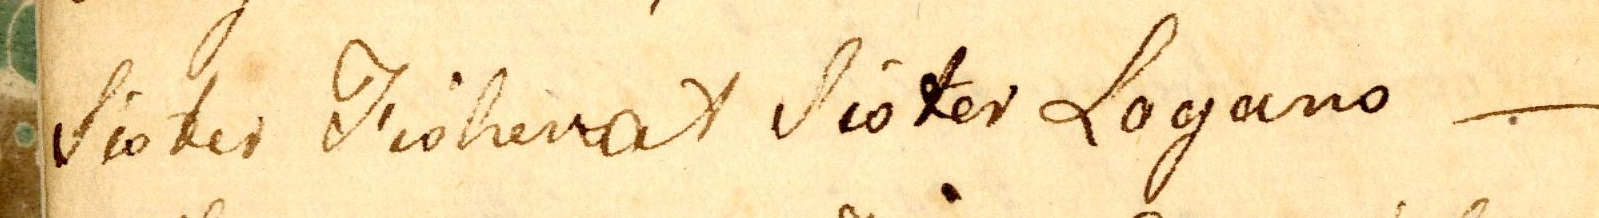Sister Fisher at Sister Logans
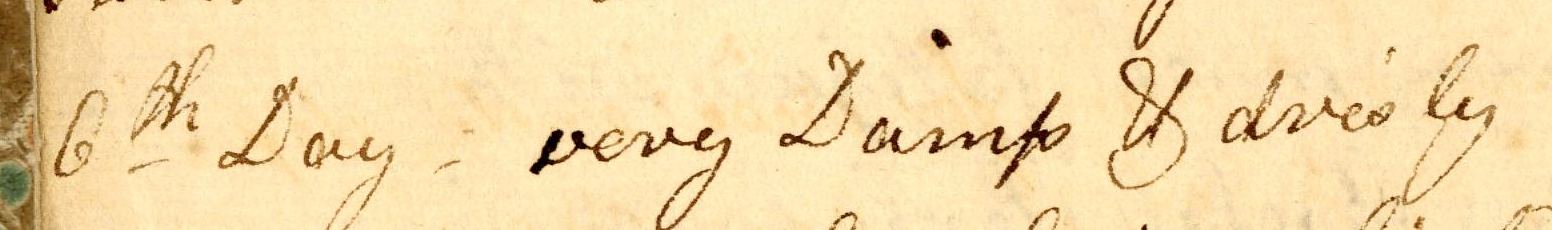6^th Day- very Damp & drisly
